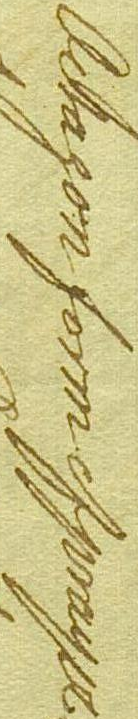Octagon form of prayer
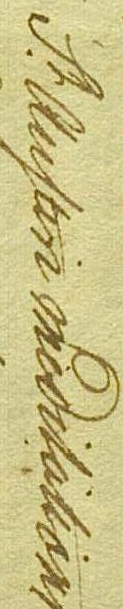S^t Austin meditations
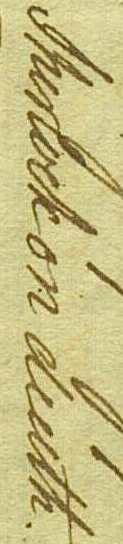Sherlock on death.
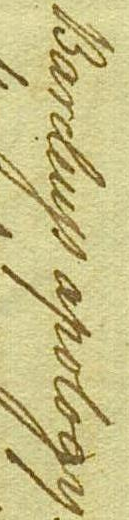Barclays apology.
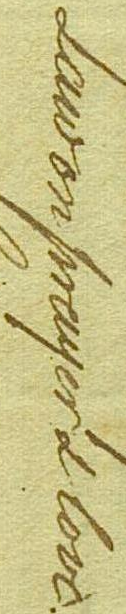Lawson prayer & love.
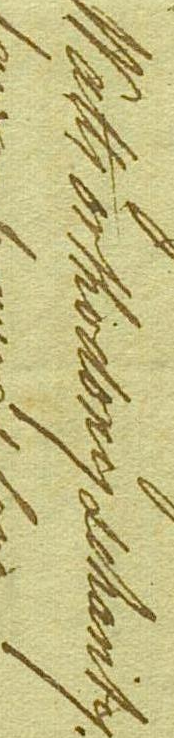Watts orthodoxy & charity.
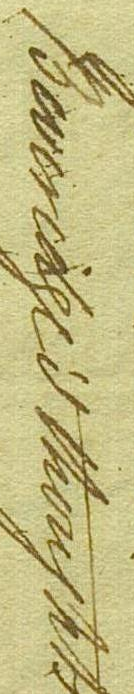Beveridge's thoughts
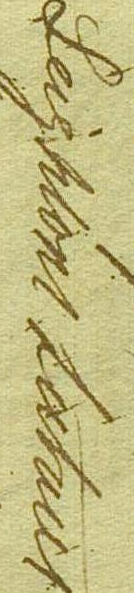Leightons Lectures
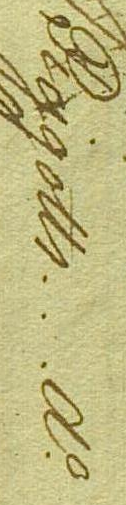Piggotts . . . d^o
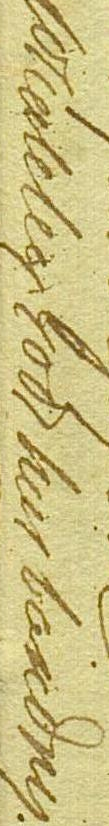Whaleley 100 her bandry.
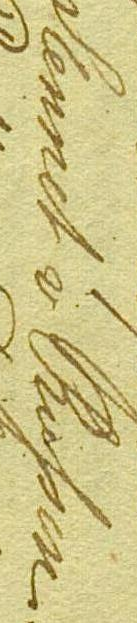Stennet v Russen.
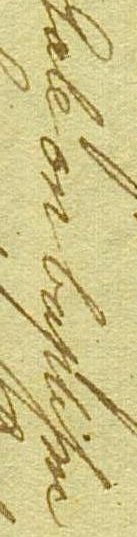Gale on baptism
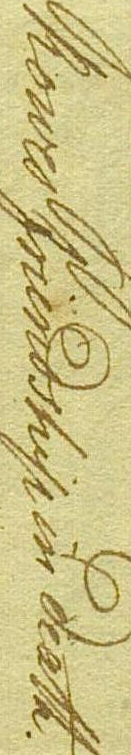Rowes friendship in death.
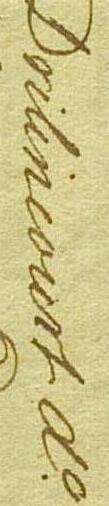Drilincourt d^o.
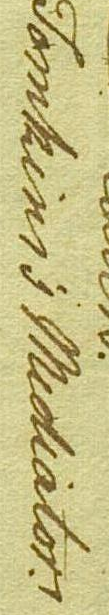Tomkin's Mediator.
